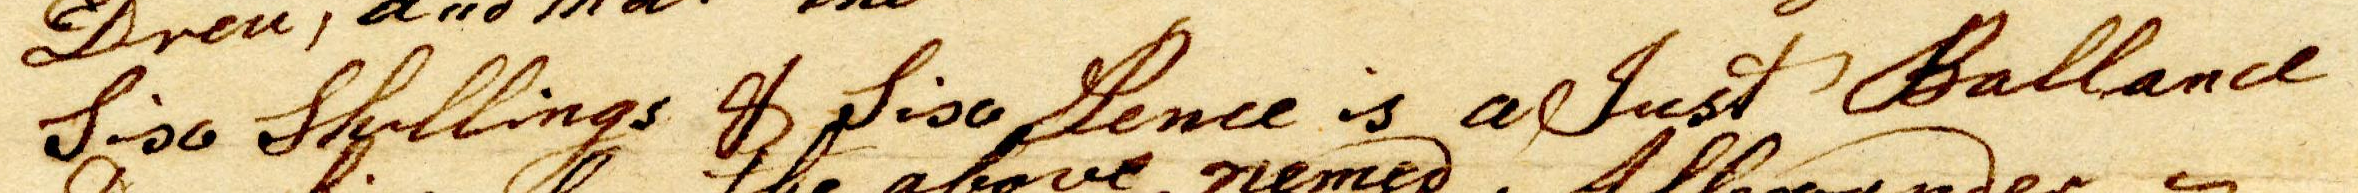Six Shillings & Six Pence is a Just Ballance
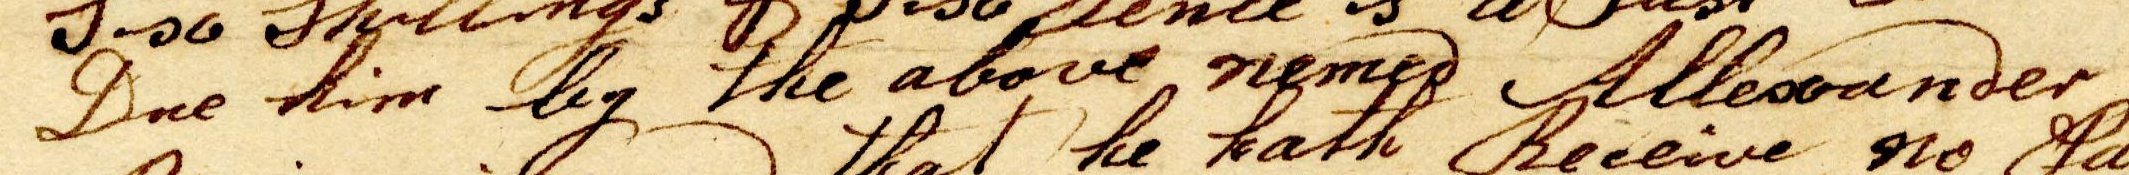Due him by the above named Allexander
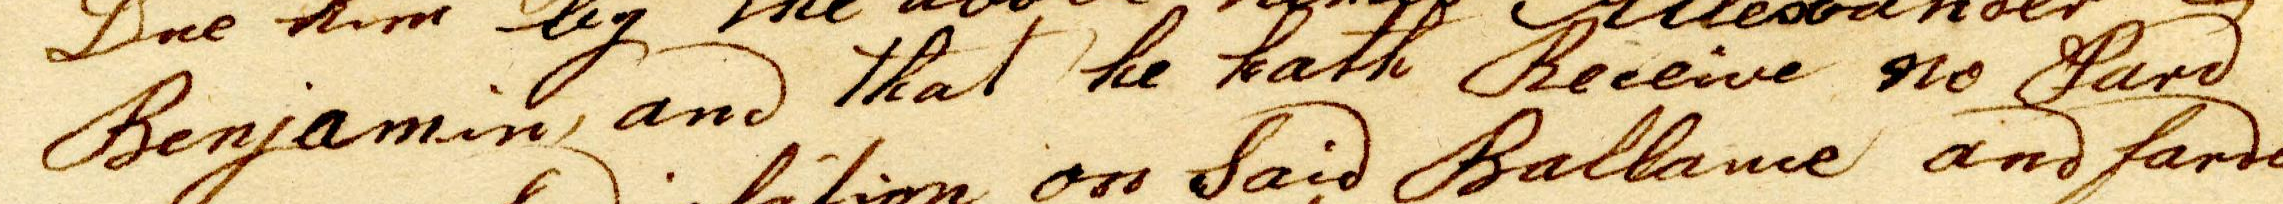Benjamin, and that he hath Receive no Pard
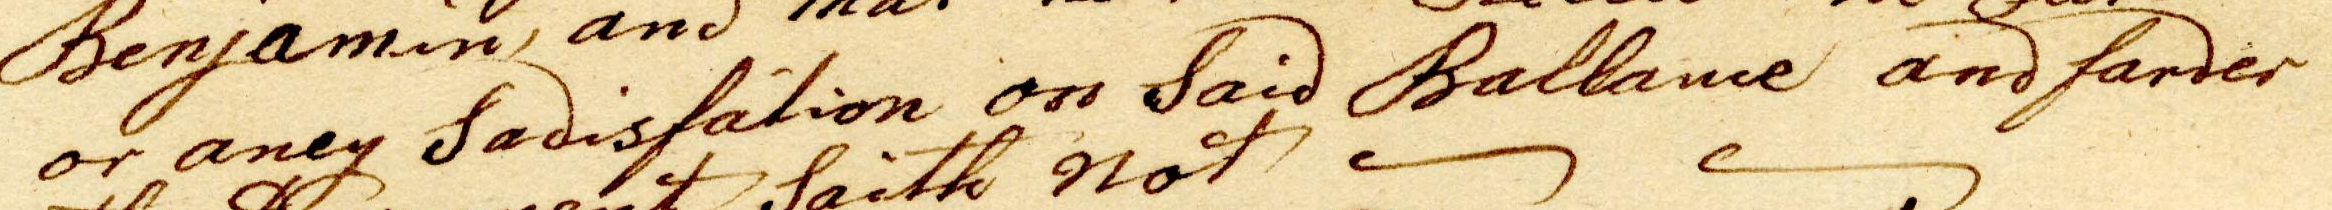or aney Sadisfation on said Ballance and farder
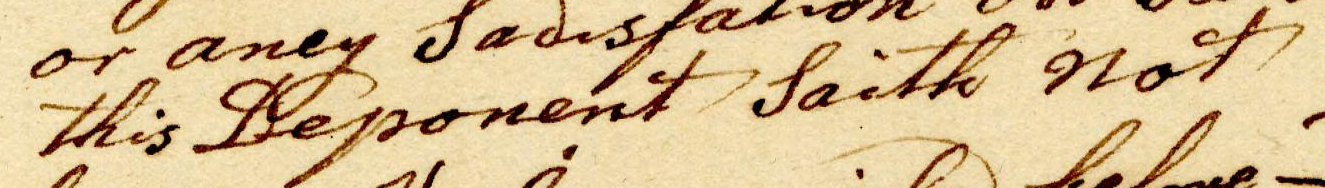this Deponent Saith not
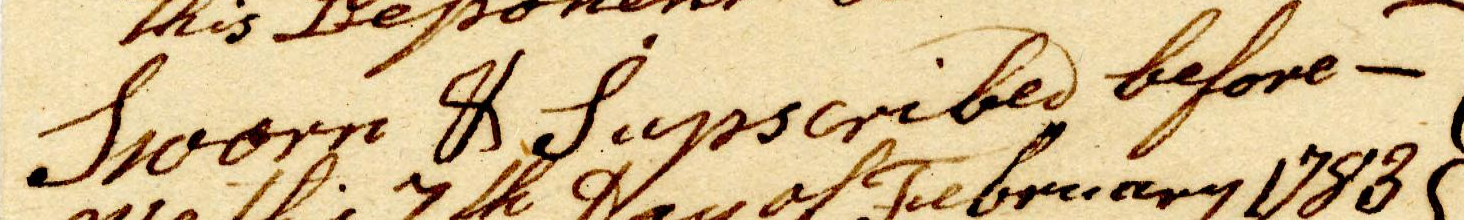Sworn & Supscribed before
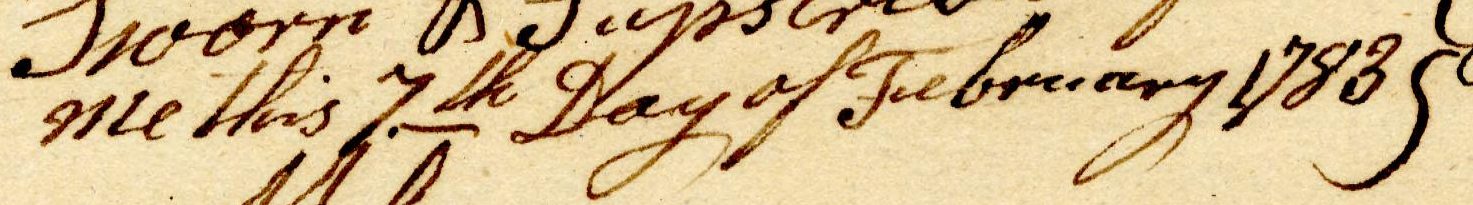me this 7^th. Day of February 1783
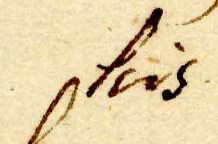sirs
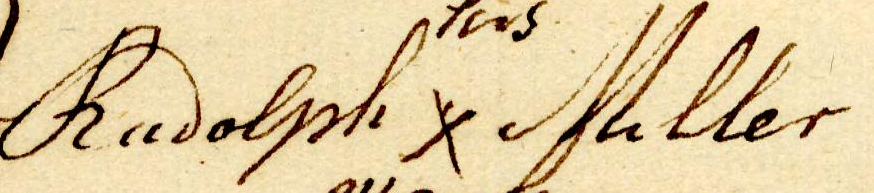Rudolph Miller
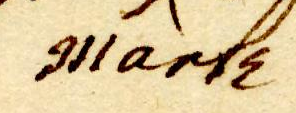Marte
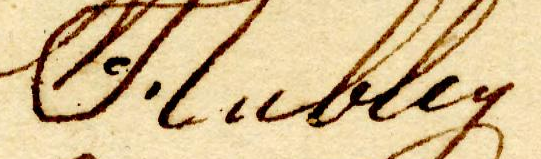M. Cubley
